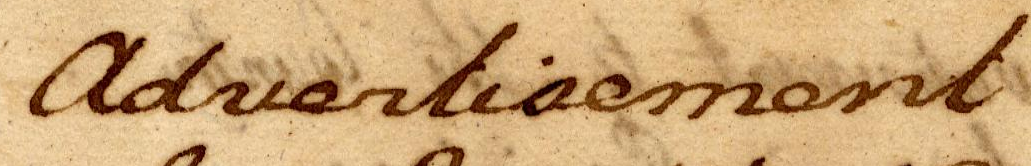Advertisement
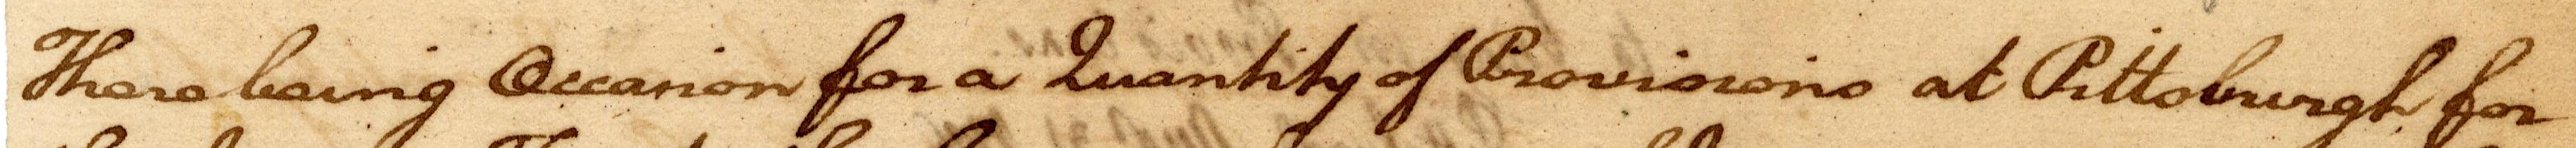There being Occasion for a Quantity of Provisions at Pittsburgh for
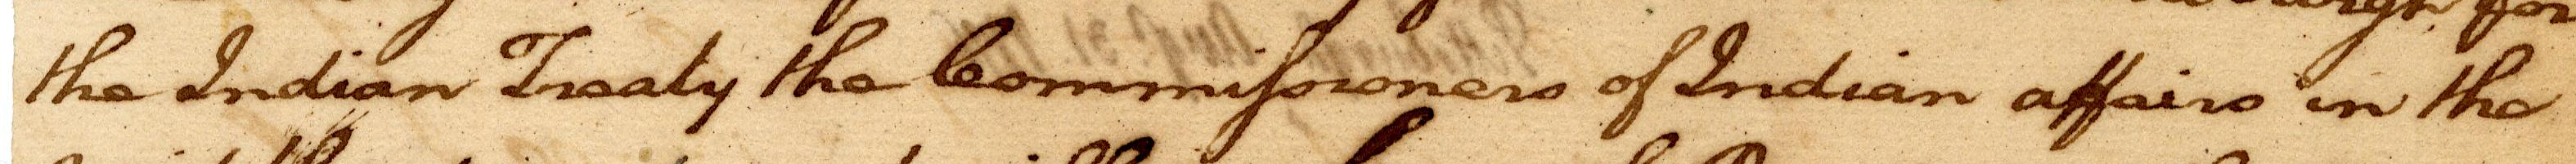the Indian Treaty the Commissioners of Indian affairs in the
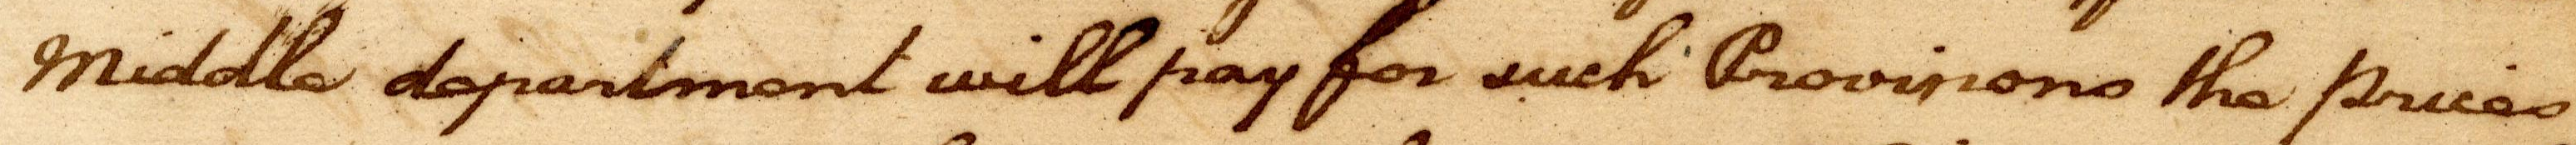Middle department will pay for such Provisions the Prices
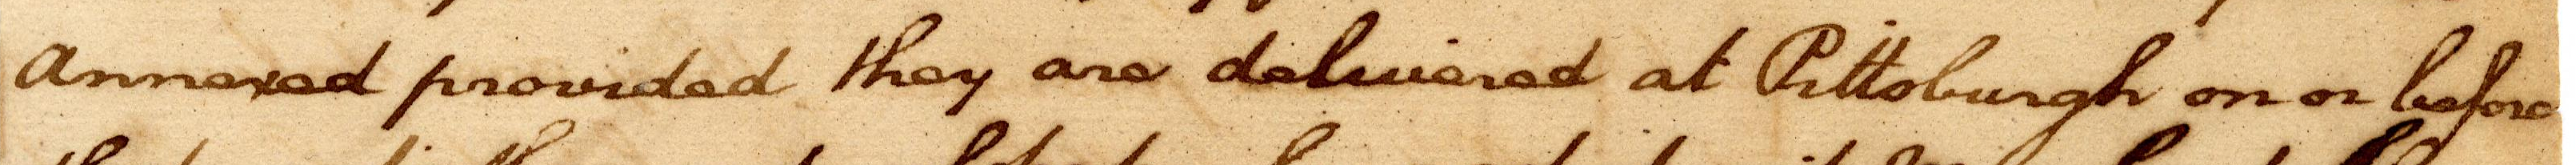Annexed provided they are delivered at Pittsburgh on or before
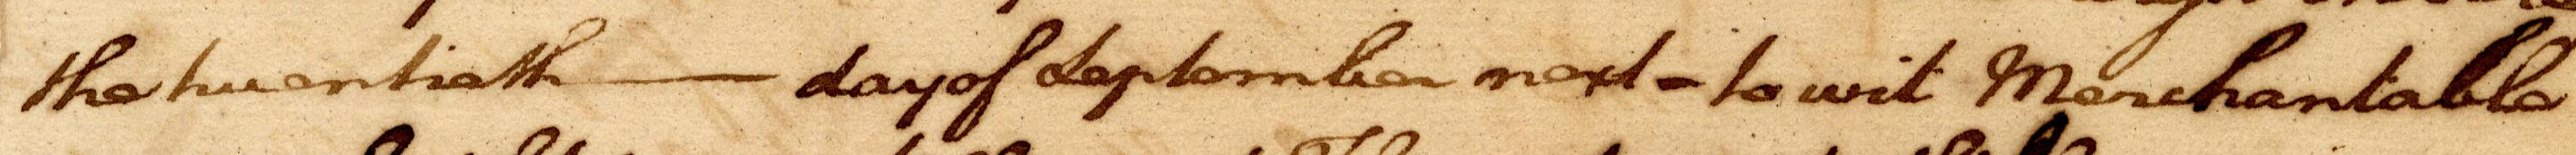the twentieth – day of September next- to wit Merchantable
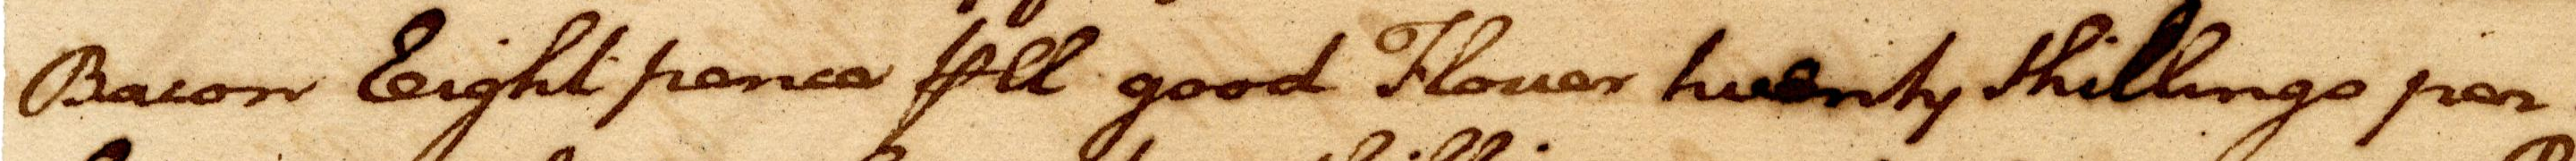Bacon Eight pence all good Flouer twenty Shillings per
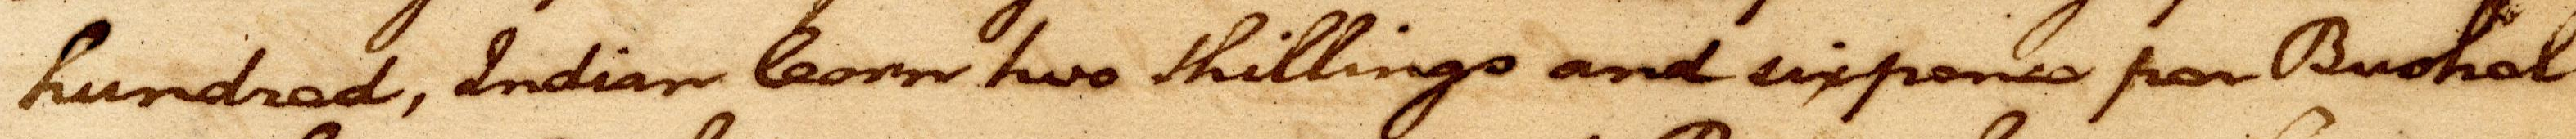hundred, Indian corn two shillings and six pences per Bushel
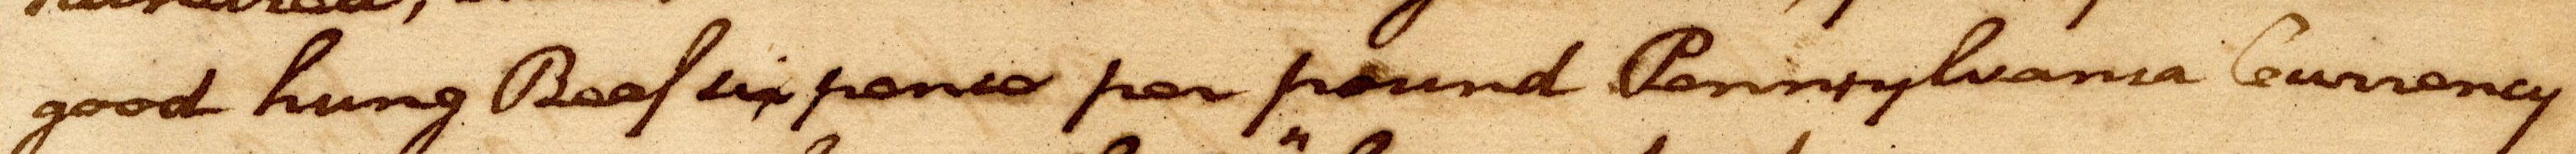good hung Beef six pence per pound Pennsylvania Currency
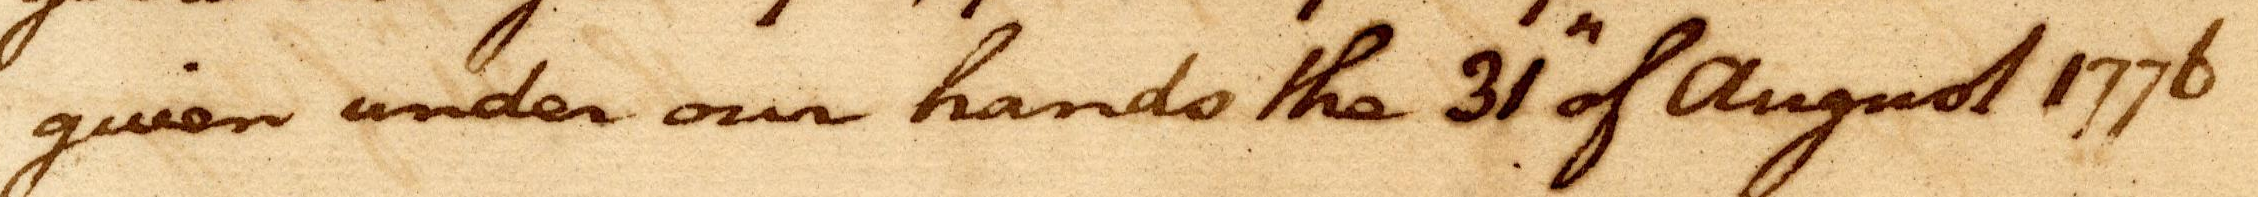given under our hands the 31^t of August 1776
